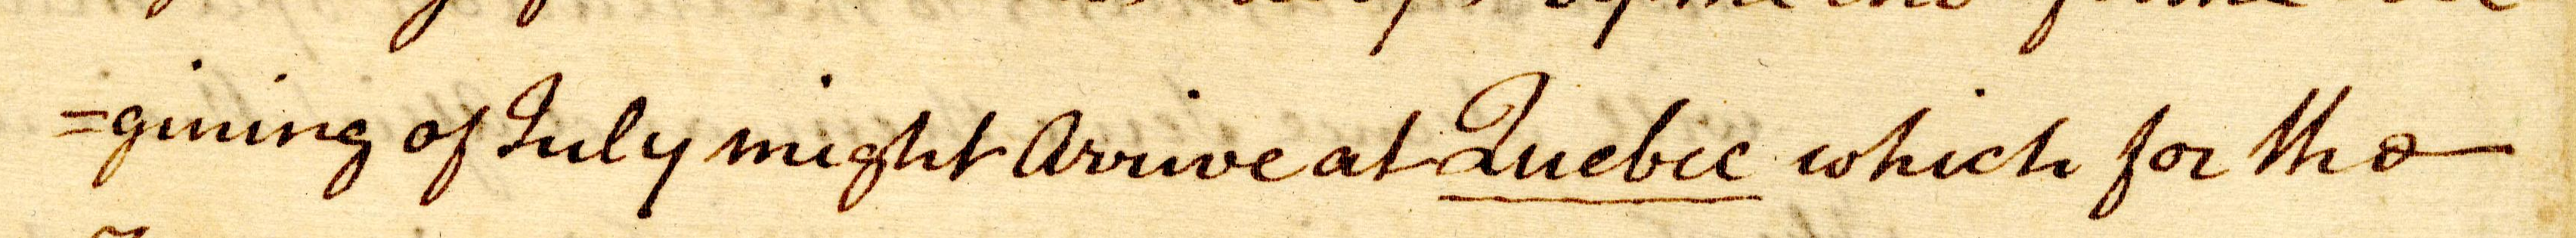-gining of July might Arrive at Quebec which for the
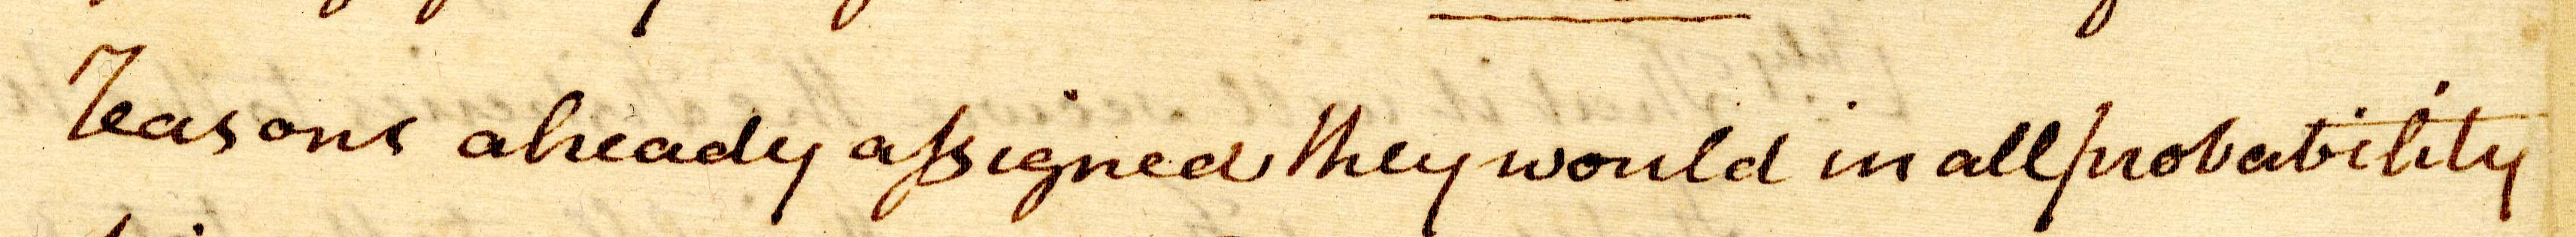reasons already assigned they would in all probability
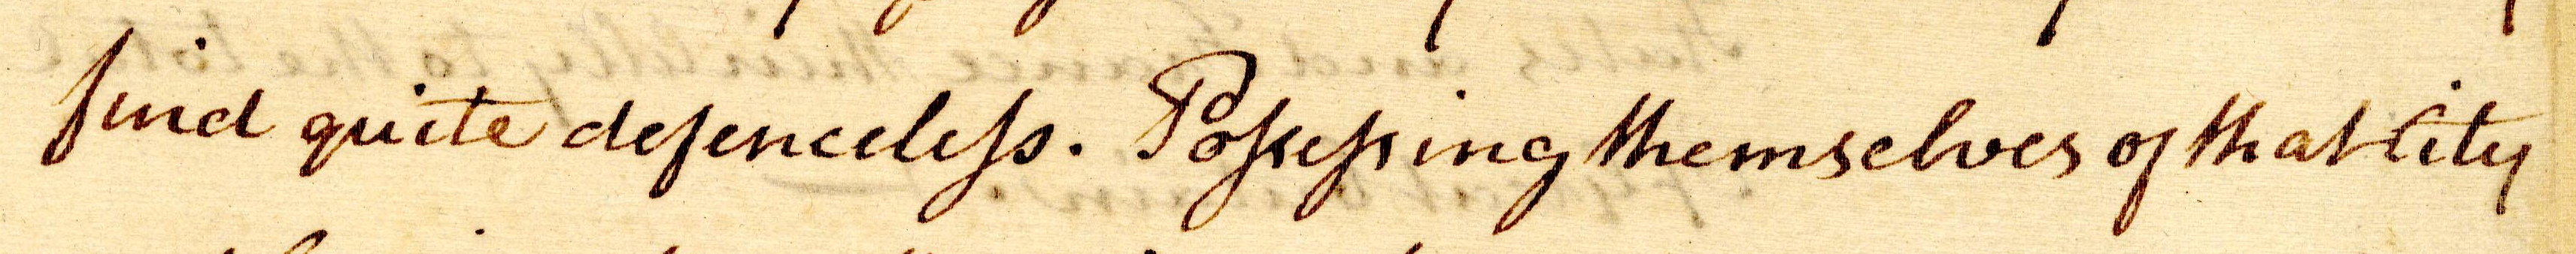find quite defenceless. Possessing themselves of that City
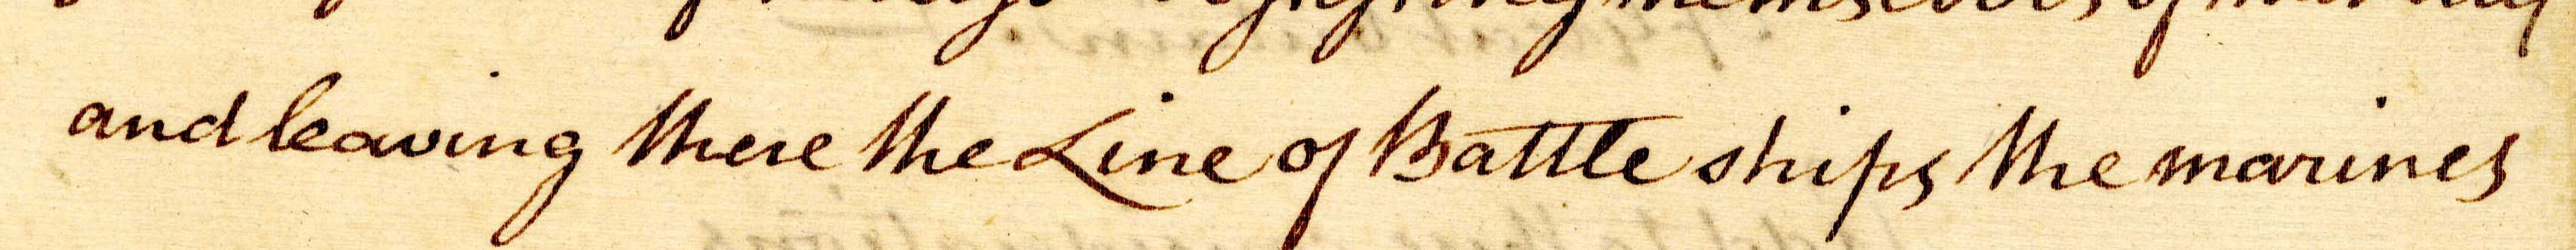and leaving there the Line of Battle ships the marines
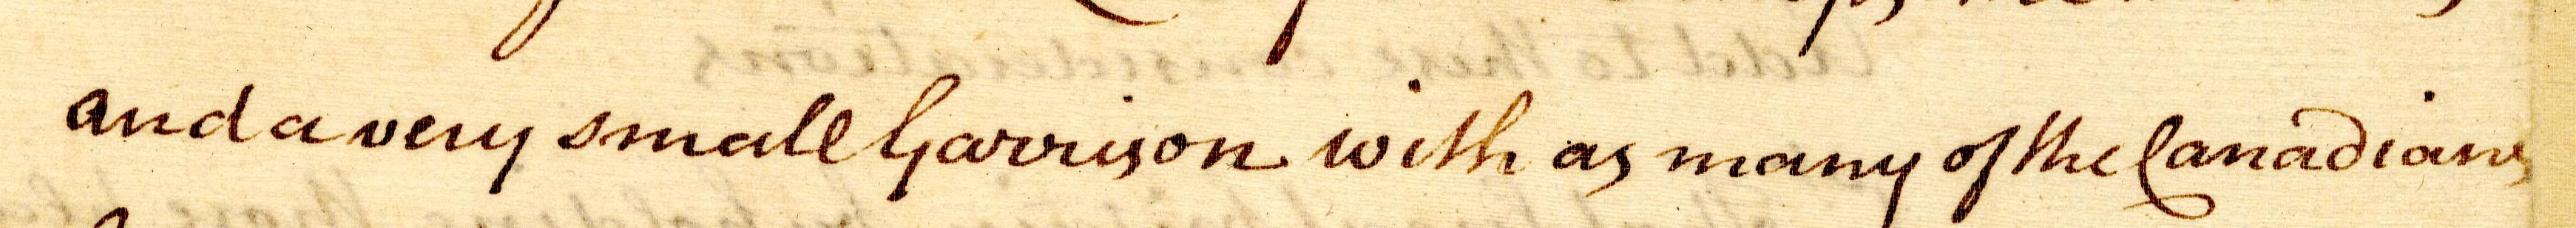and a very small Garrison with as many of the Canadians
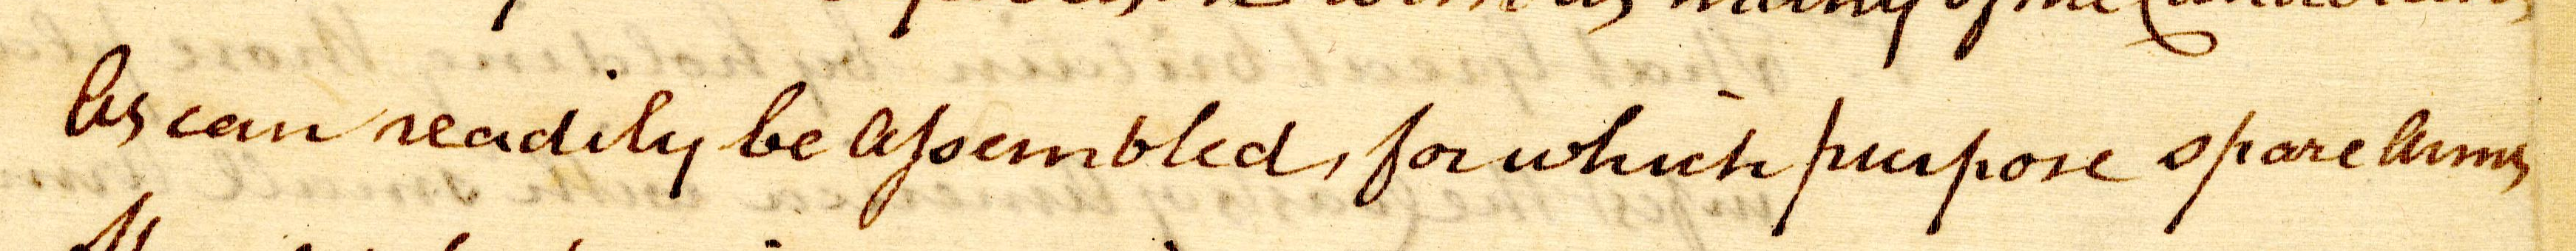As can readily be Assembled, for which purpose spare Arms
